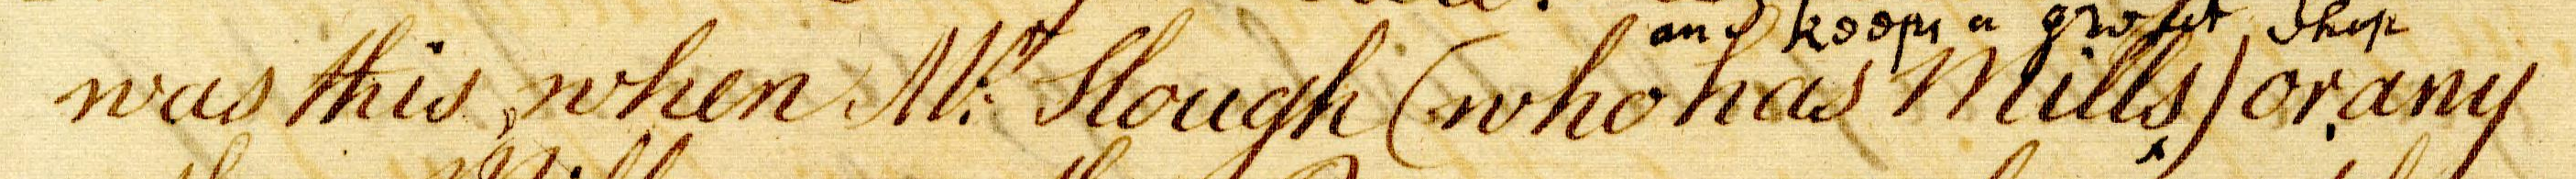was this, when M^r. Hough (who has Mills ^) or, any
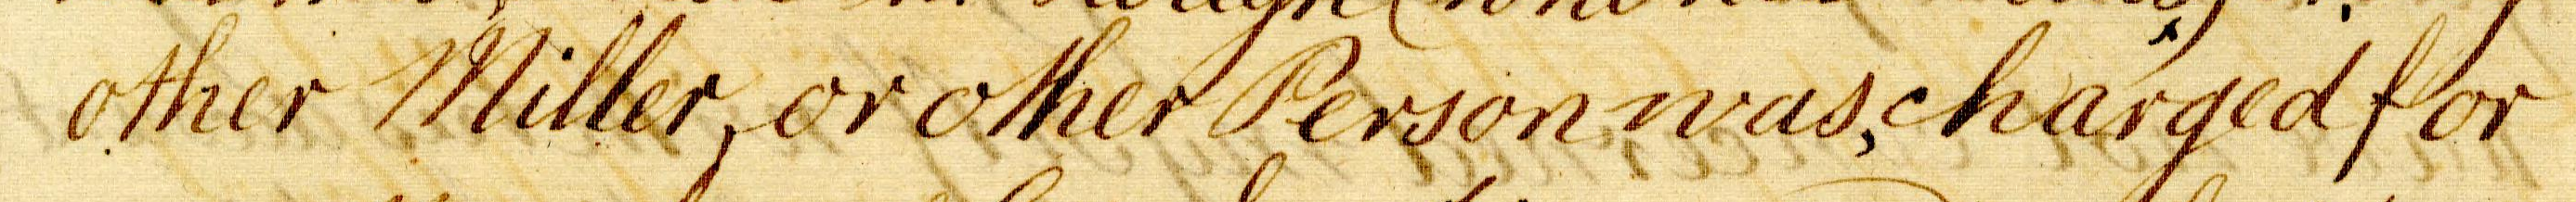other Miller, or other Person was, charged for
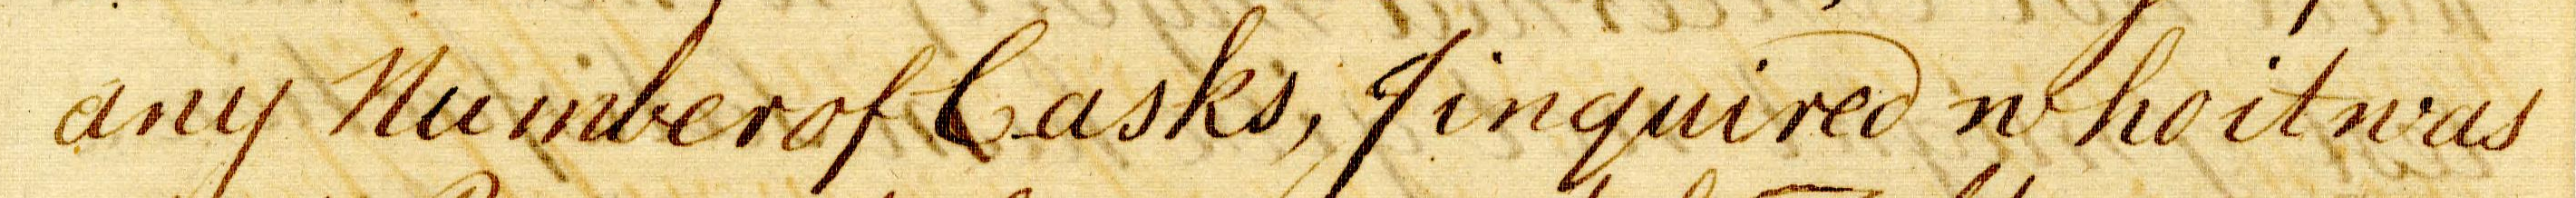any Number of Casks, I inquired who it was
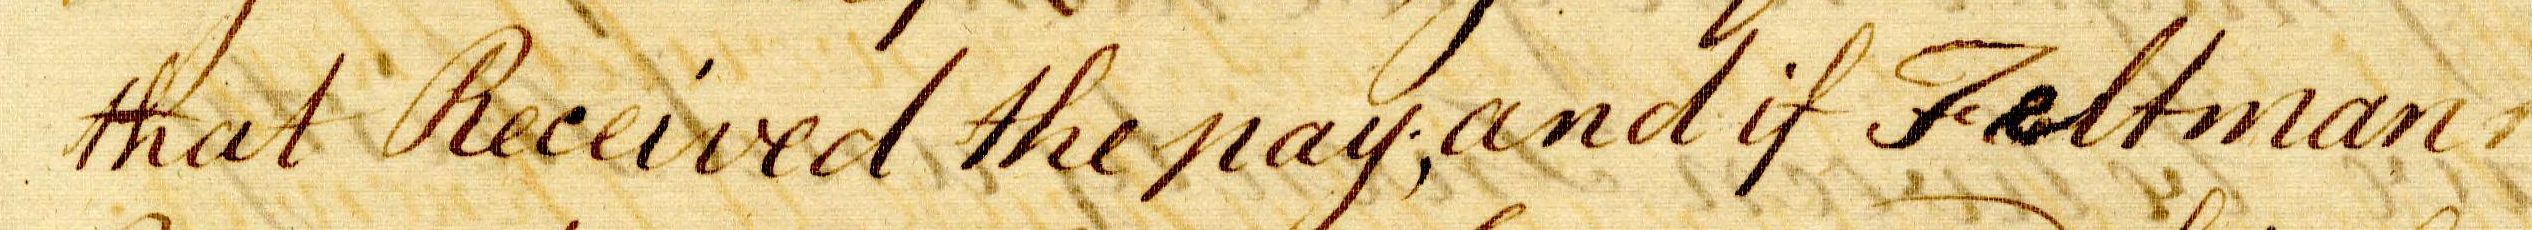that Received the pay; and if Feltman
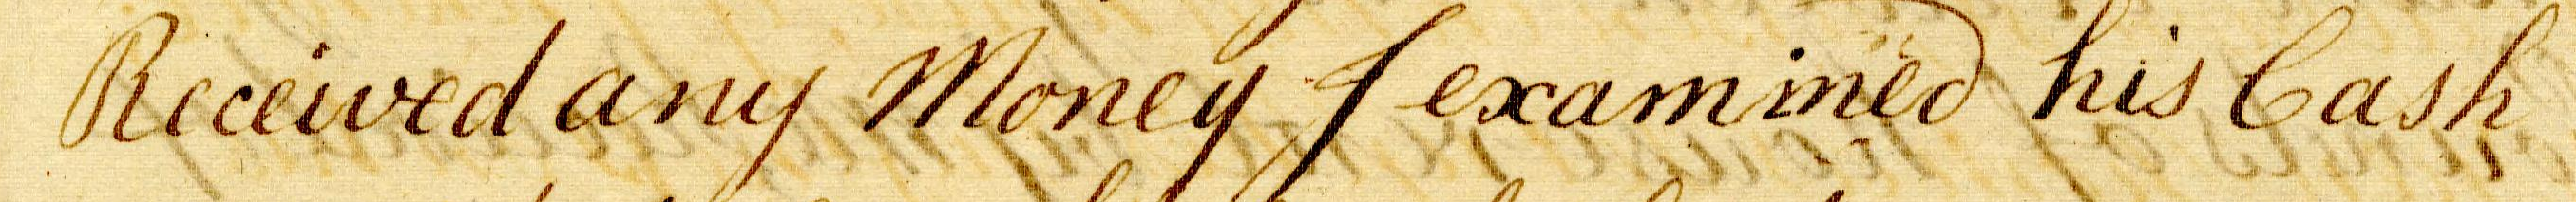Received any Money I examined his Cash
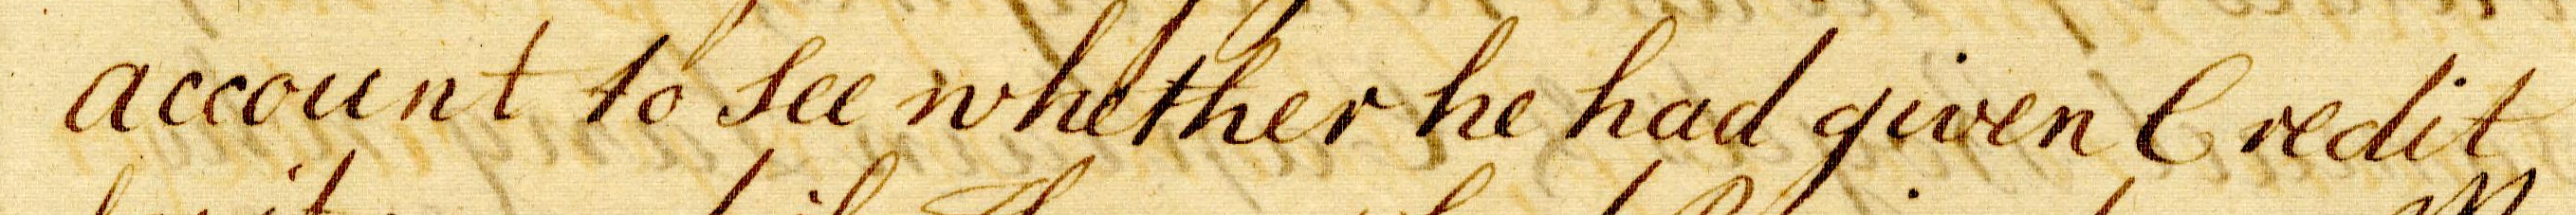account to see whether he had given Credit
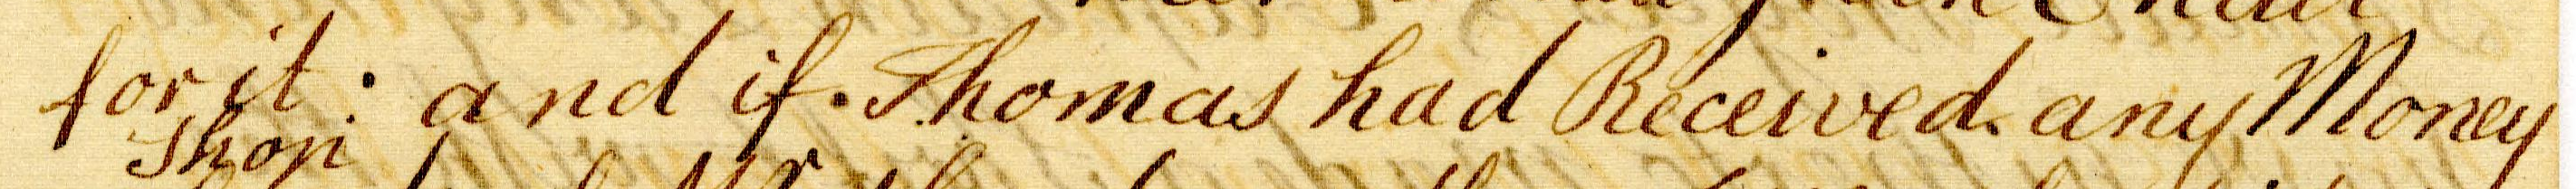for it: and if Thomas had Received any Money
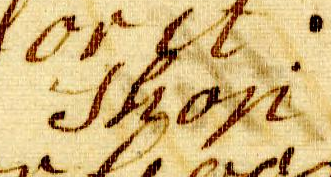Shop
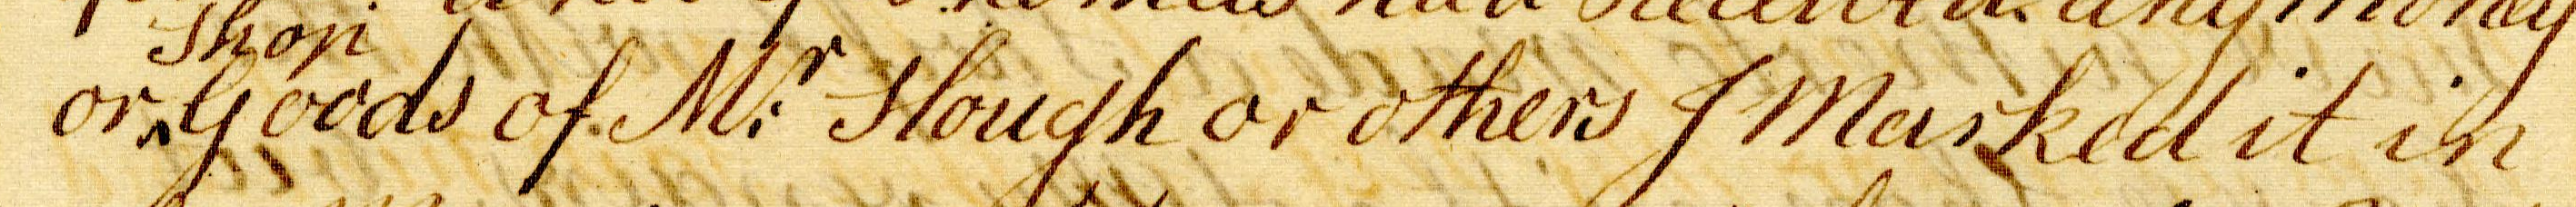or ^ Goods of M:^r Hough or others Marked it in
